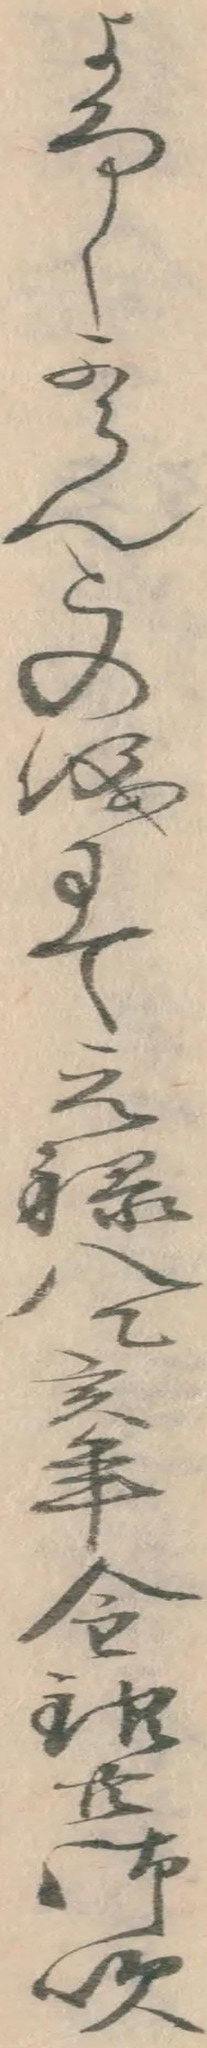よろしからんとの儀にて元禄八乙亥年金銀共御吹
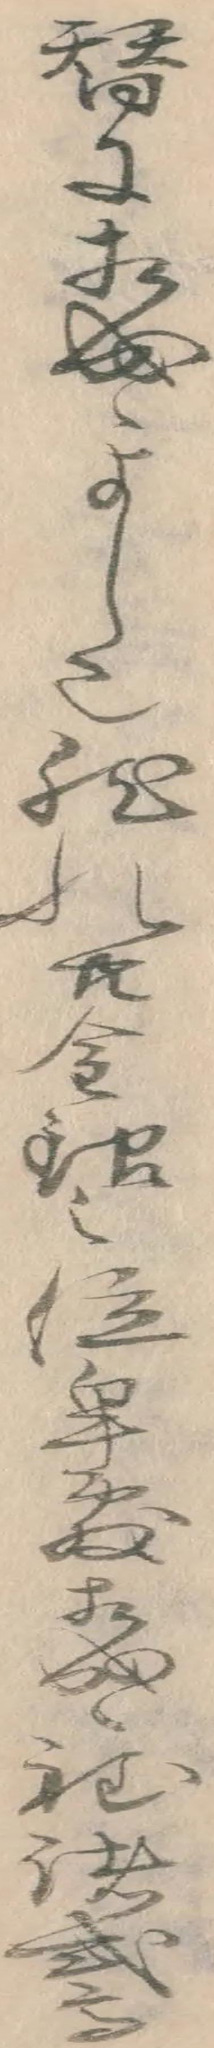替に相成候よし也然れ共金銀之位卑敷相成候程諸式高
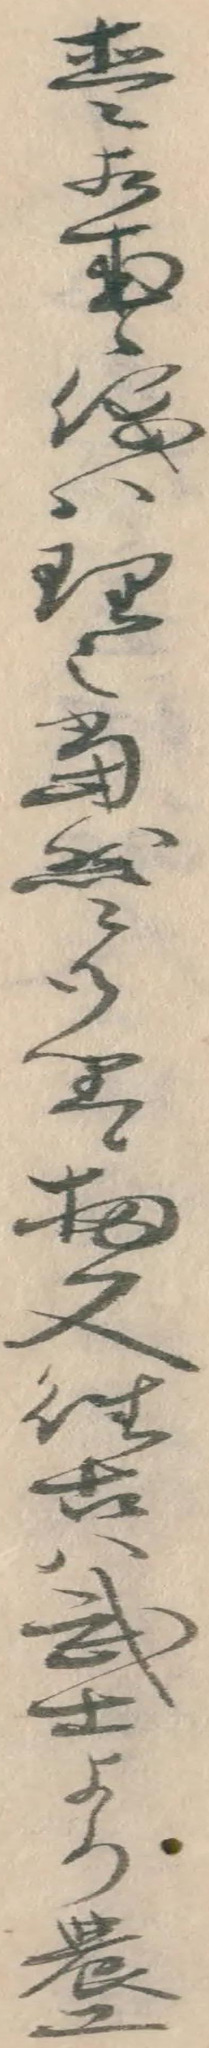直に相成候儀は理之当然に御坐候扨又往古は武士より農工
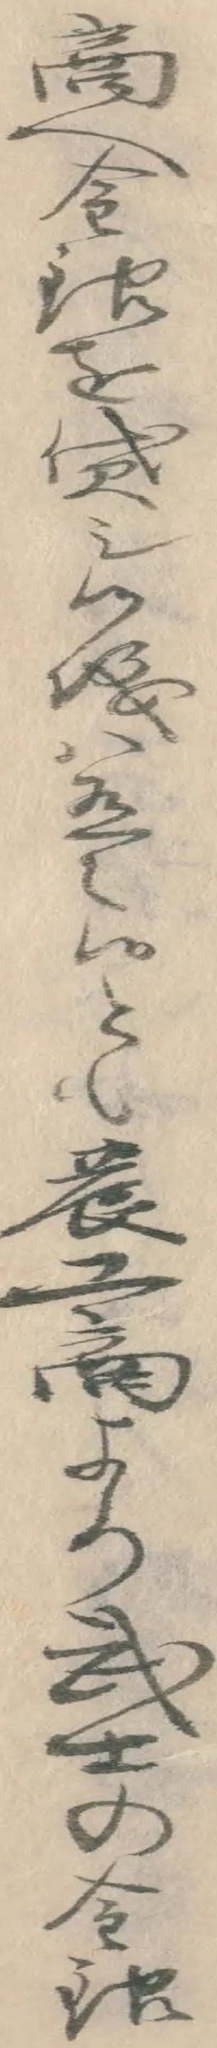商へ金銀を貸し候儀は有之候とも農工商より武士の金銀
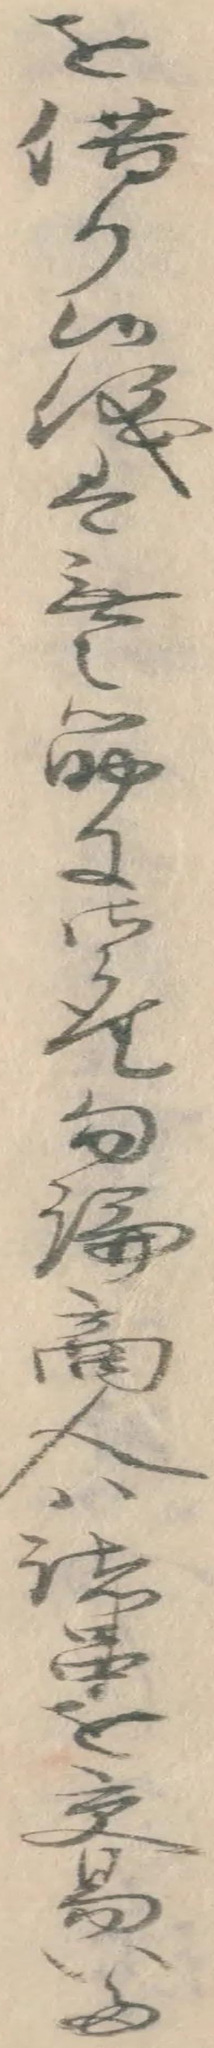を借り候儀は無之筋に御座候勿論商人は諸品を交易いた
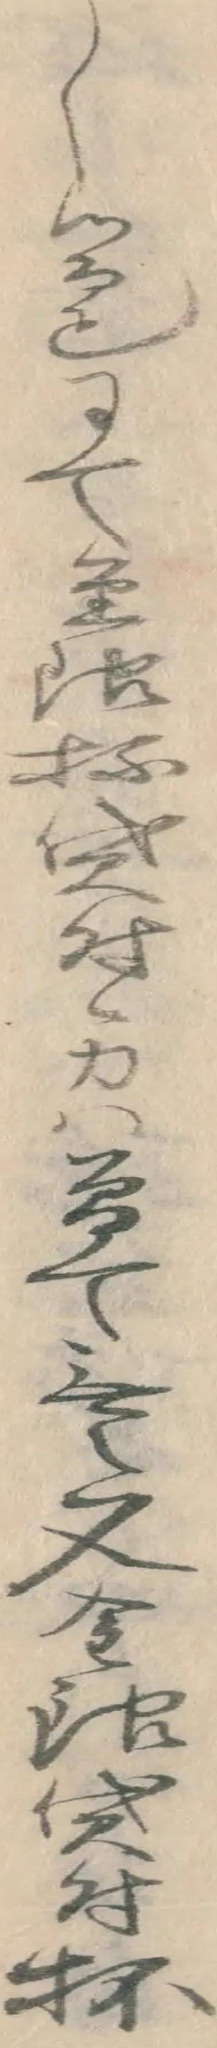し候而已にて金銀抔貸付候力は曽て無之又金銀貸付抔

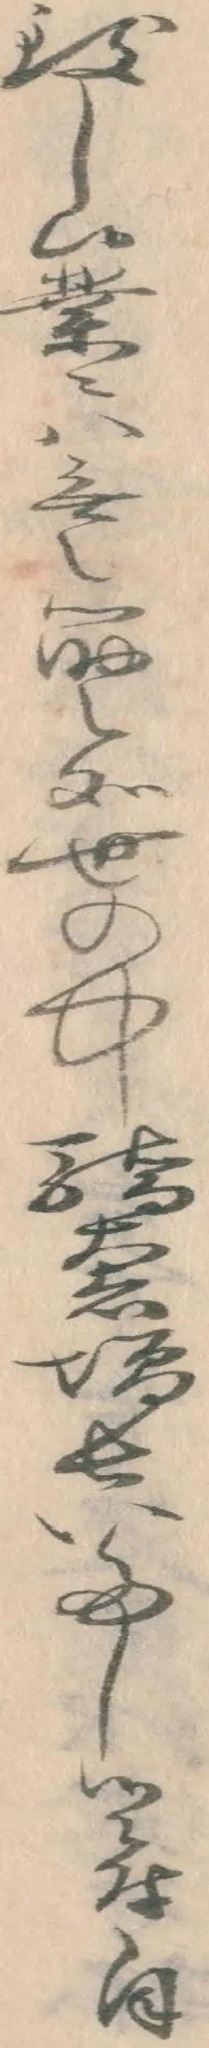致し候業には無之筋之処世の中驕奢増長いたし候に付自
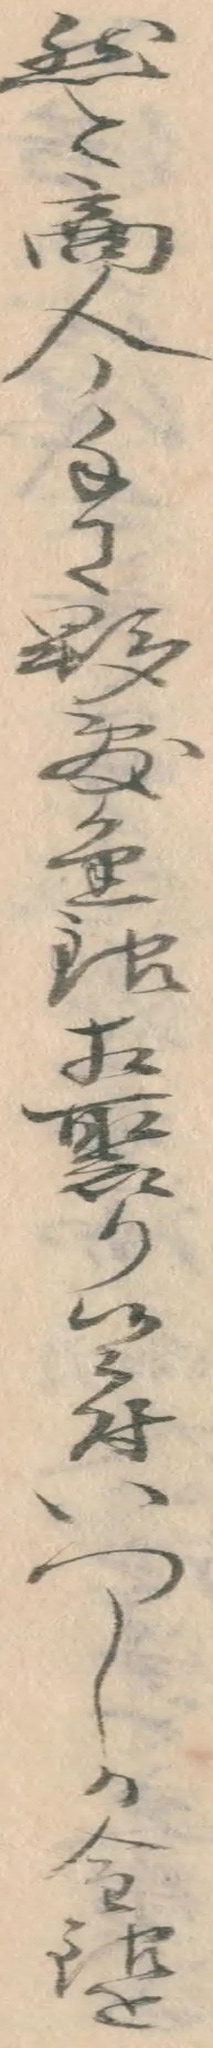然と商人の手に夥敷金銀相聚り候に付いつしか金銀を
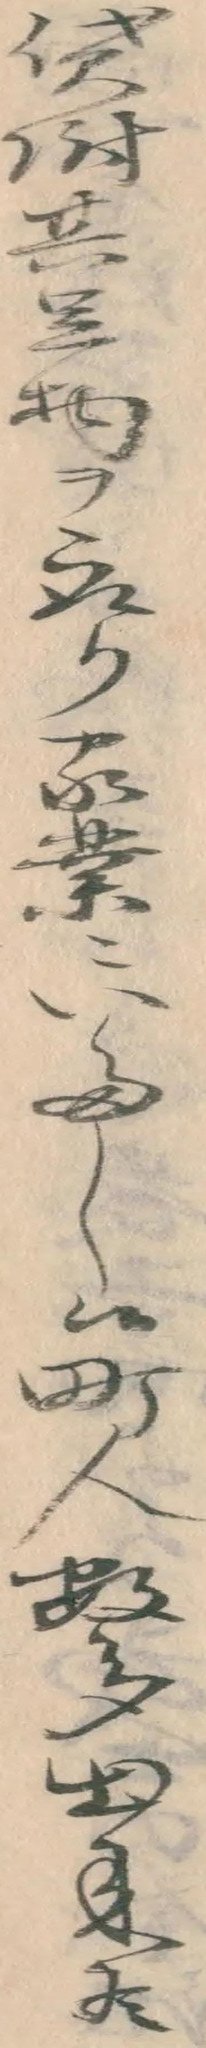貸附其足物を取り家業にいたし候町人数多出来候
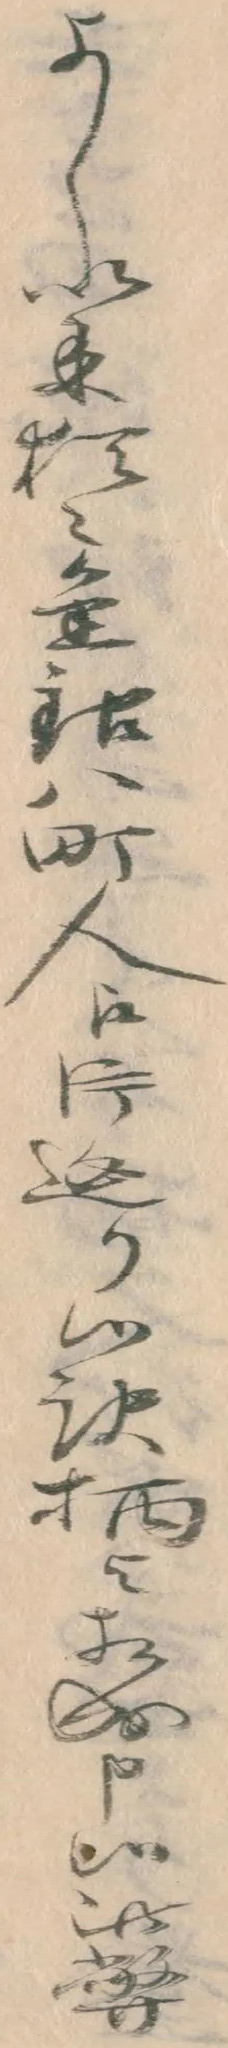よし以来猶々金銀は町人え片迥？り候訳柄と相成申候此弊
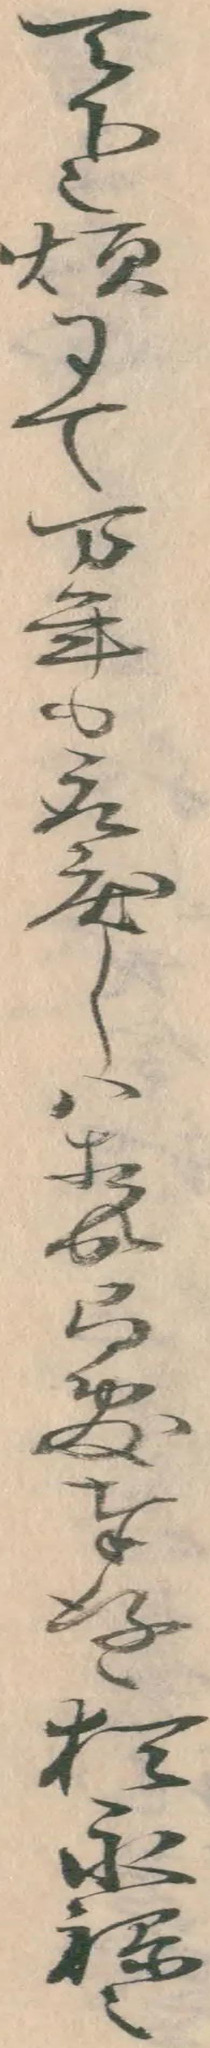天下之煩にて万年も取戻しは相成間敷奉存候猶永禄之
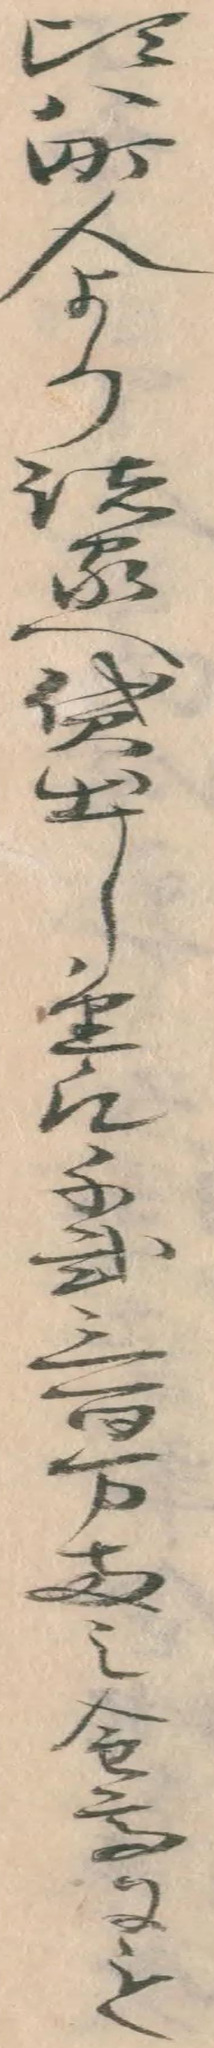頃は町人より諸家へ貸出し金凡千弐三百万両之金高にも
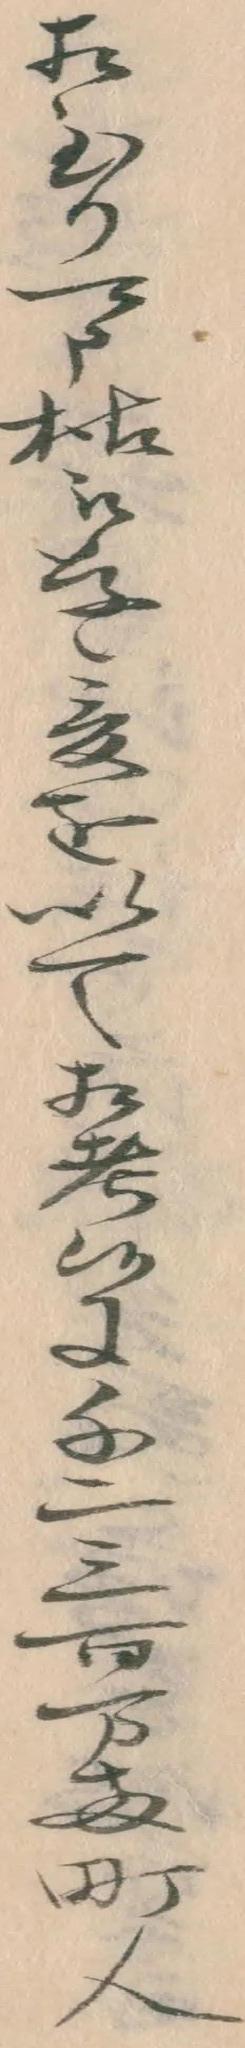相至り可申様被存候爰を以て相考候に千二三百万両町人
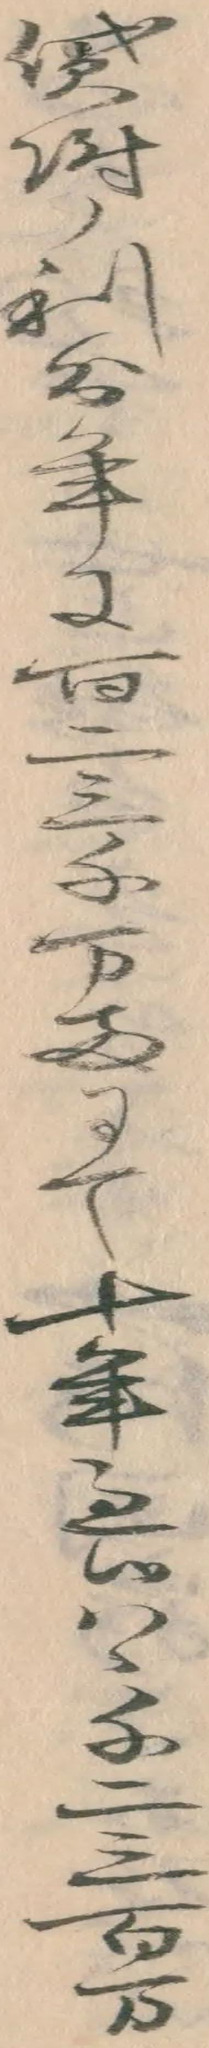貸附の利分年に百二三千万両にて十年過候はゝ千二三百万
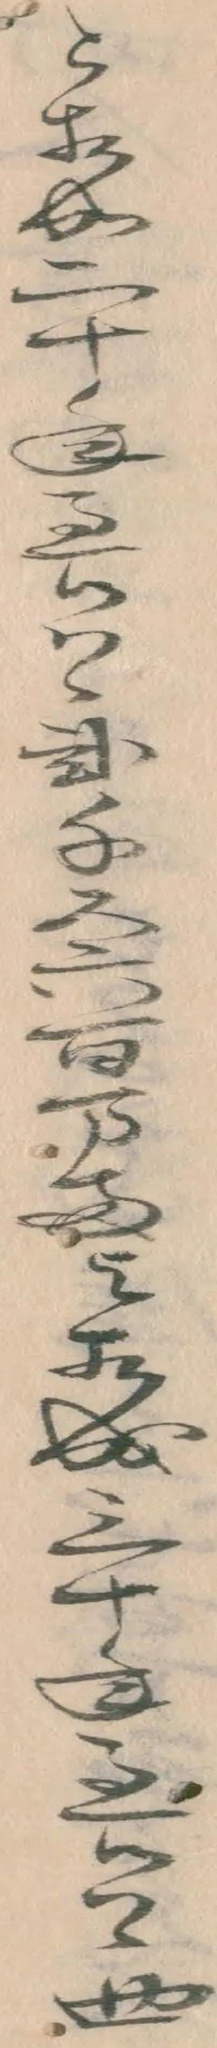と相成二十年過候はゝ弐千五六百万両と相成三十年過候はゝ四
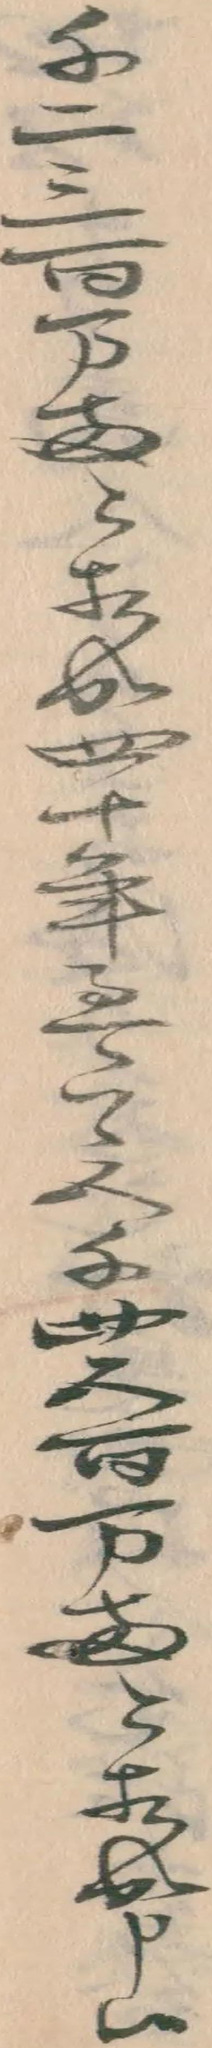千二三百万両と相成四十年過候はゝ五千四五百万両と相成申候
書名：斎庭之穂
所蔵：国立国会図書館 National Diet Library, JAPAN
